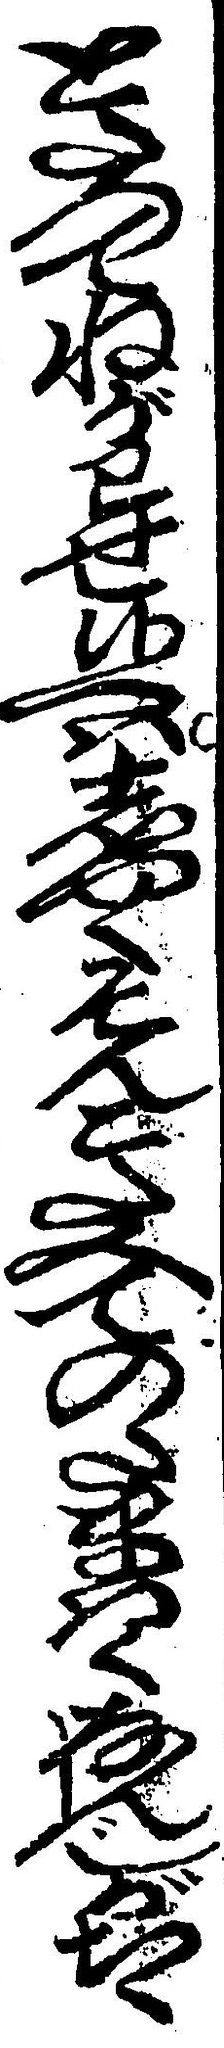とたつてねがわせ候へは。しやくそんこたへてのたまはくなんじがちゝ
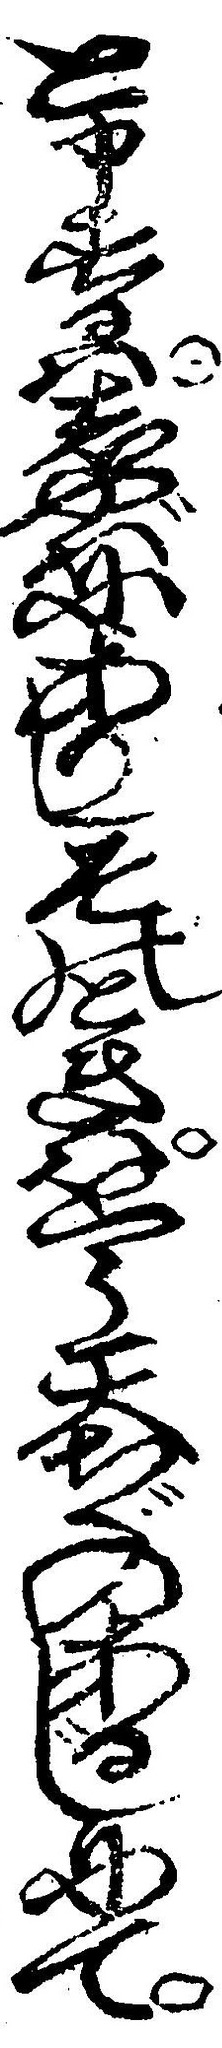と申するは。しやばにありしそのときは。とう天ぢくのあるじにて。
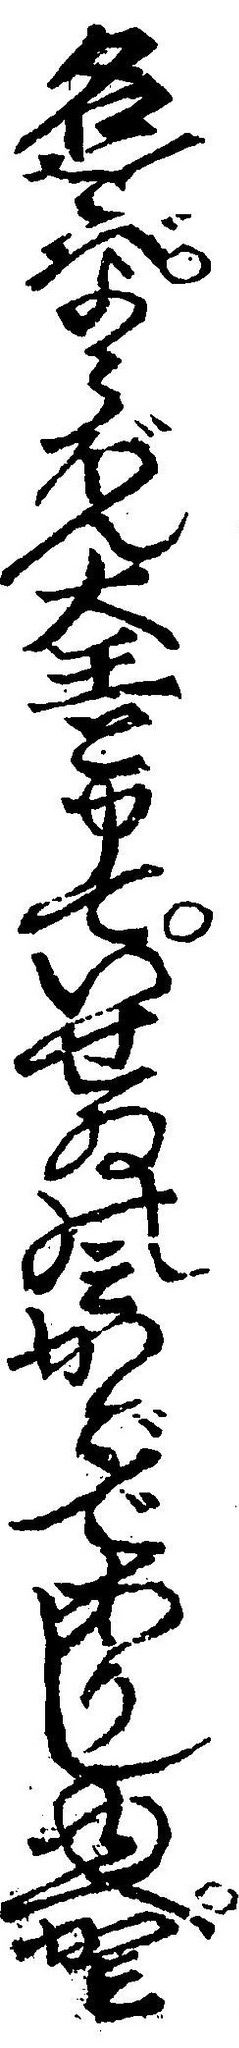名をば。ようぼん大王と申て。いせゐのみかどでありしゆへ。かみ
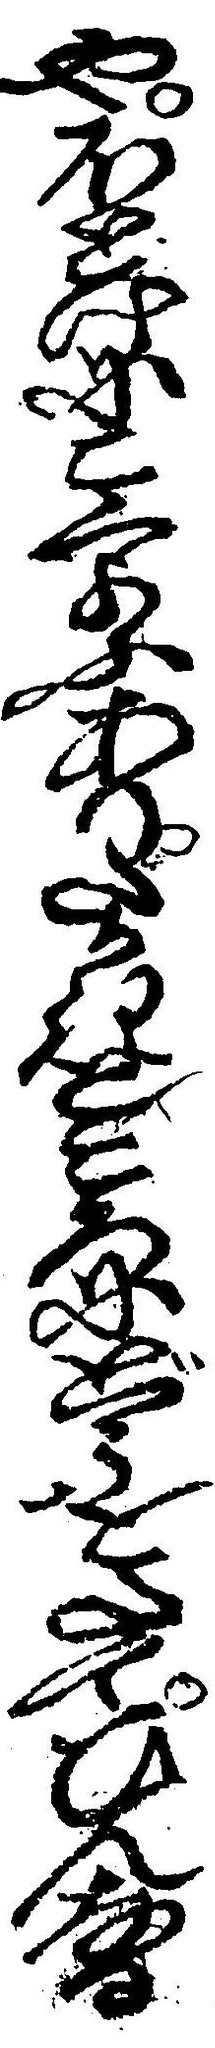や。ほとけにこくよふあり。たかきところにどうをたて。ひんなる
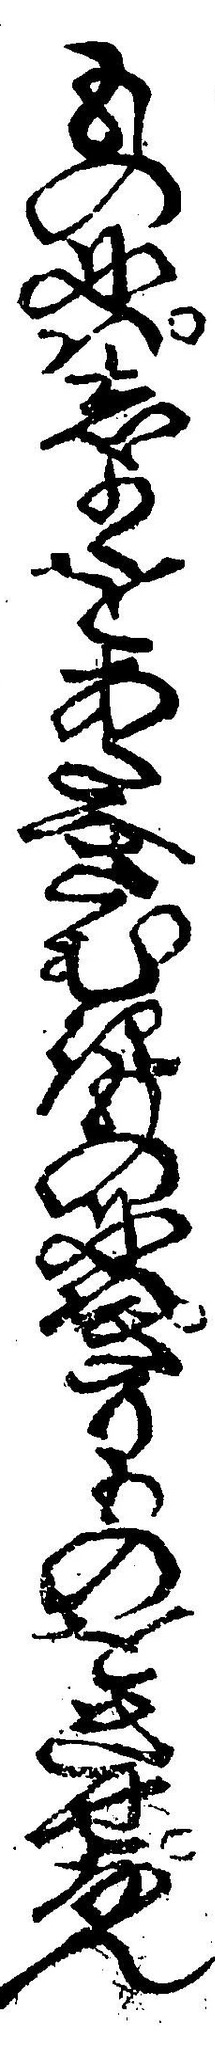ものには。しよくをあたへさむきものには。きるものをきせ。なん
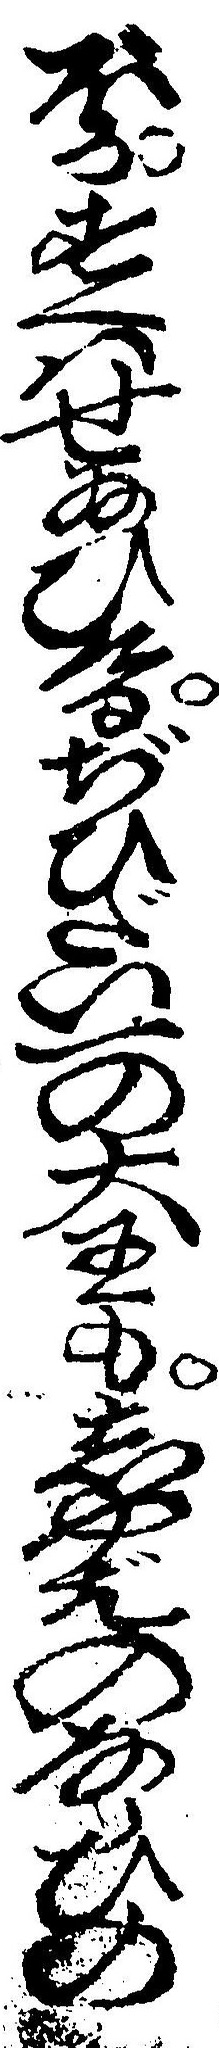ぼか。すくはせ給ひける。ぢひだい一の大王も。しやばのならひの
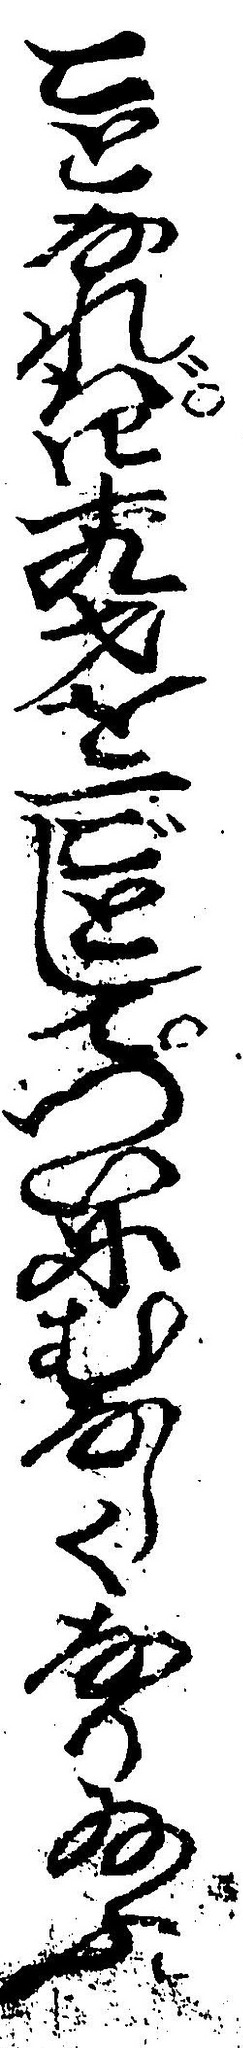ことなれば。四十九才を一ごとして。ついにむなしくなり給ふ。
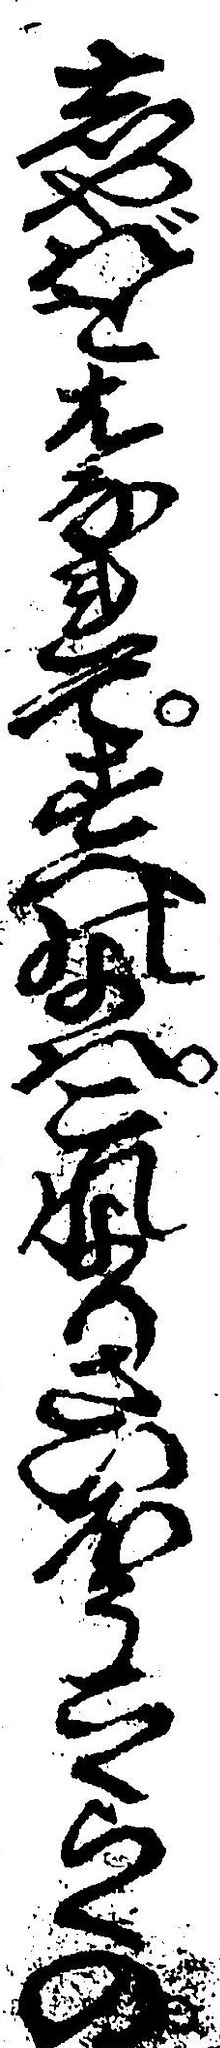しやばをはなれて。すへのよは。これよりさいほうこくらくの。

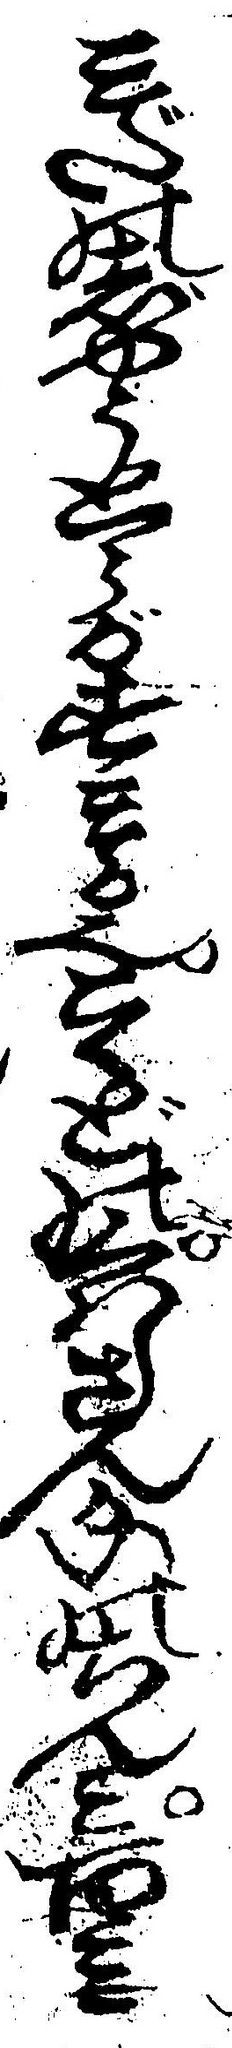みだのじやうとうがすみか也。こくどの。くわしさんかいのちんみ。百み
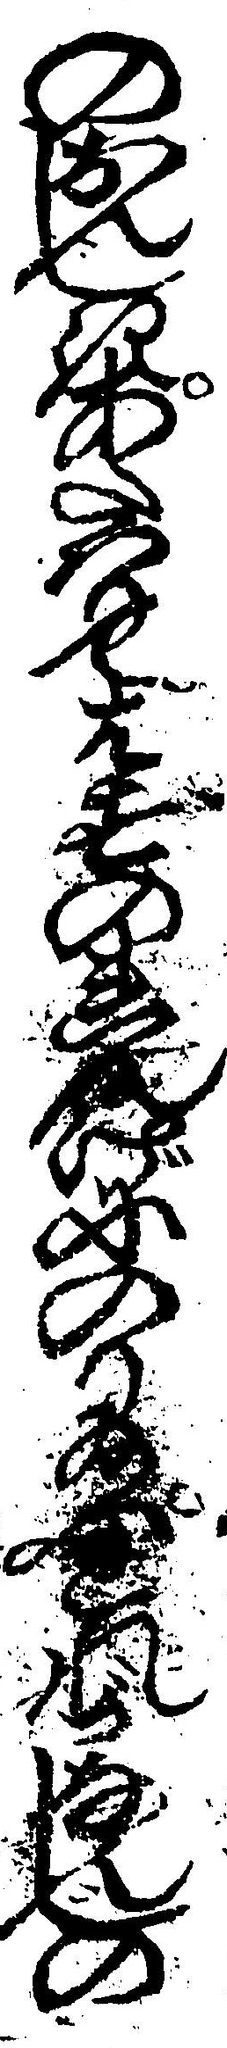のおんしき。あたはりて。はすのれんげにのり給ふ。これがなんじの
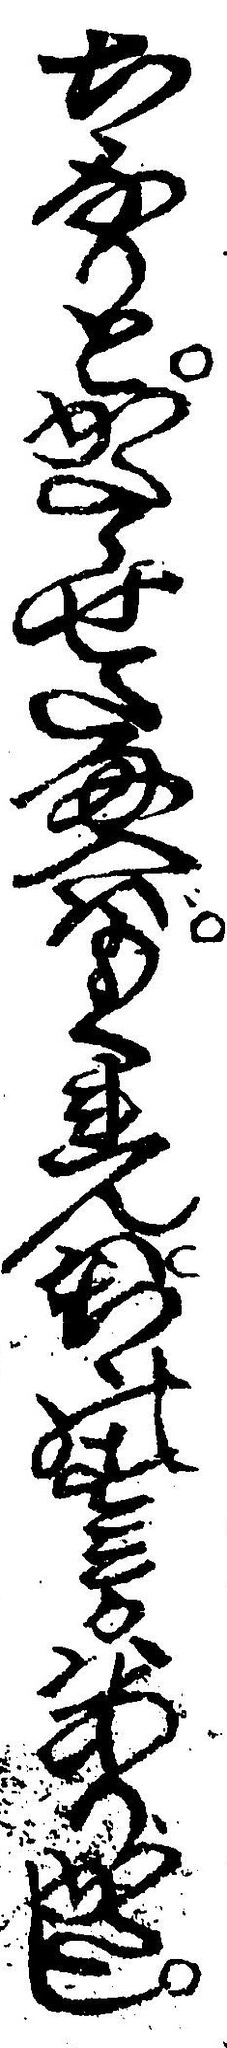ちゝなりと。かたらせたまへば。もくれんは。ちゝのすみかはありかたし。
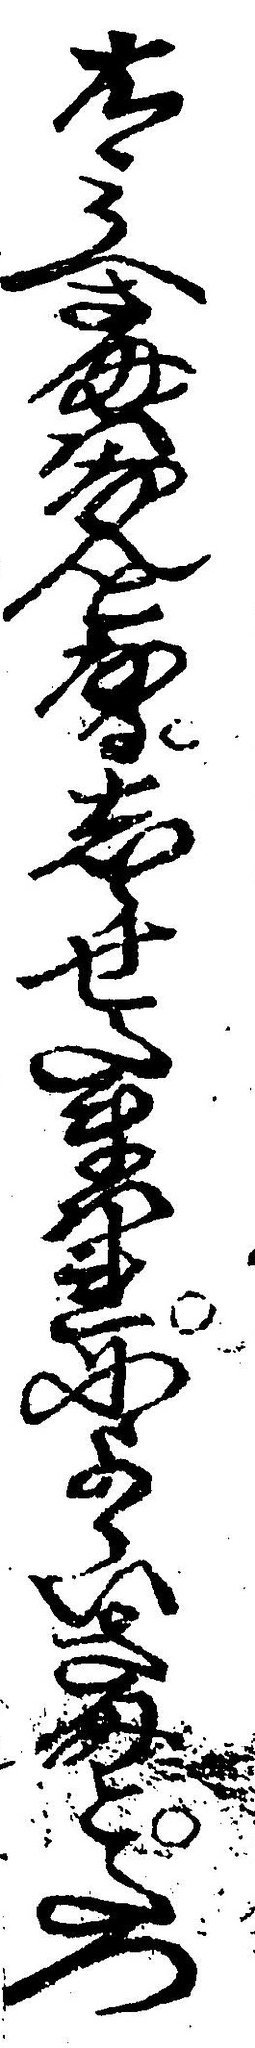はゝうへさまはなんとなる。しらせたまはれ。によらいさまと。たつ
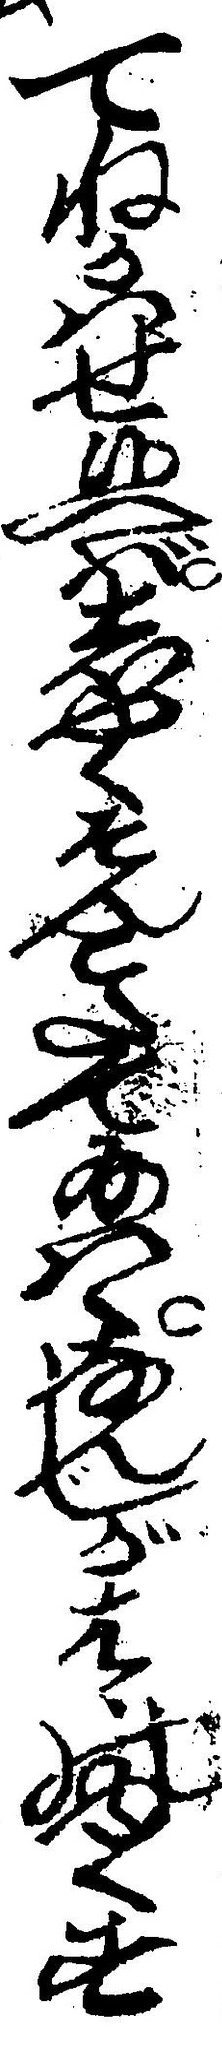てねかはせ候へば。しやくそんこたて給はく。なんじがはゝのゆくす
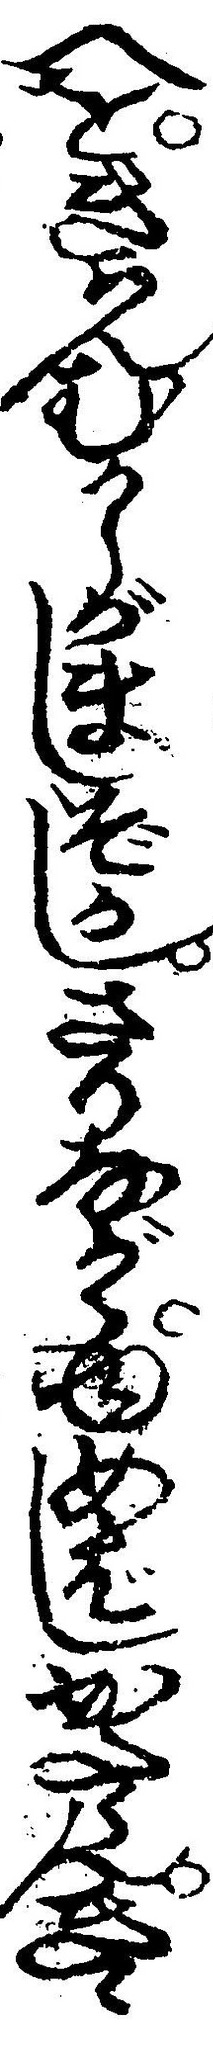へをきかんむかしがましぞかし。さりながら。ゆめばしかたらん。きゝ
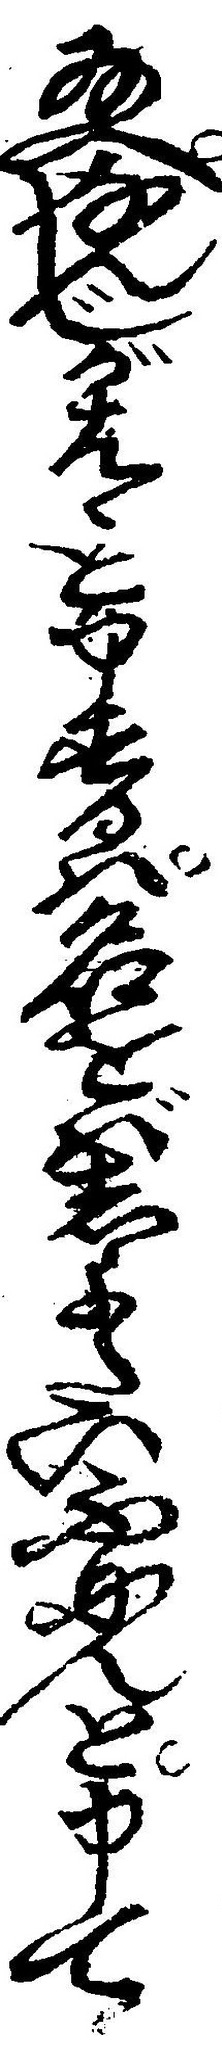給へ。なんじがはゝと申するは。名をばしよさいふにんと。申て
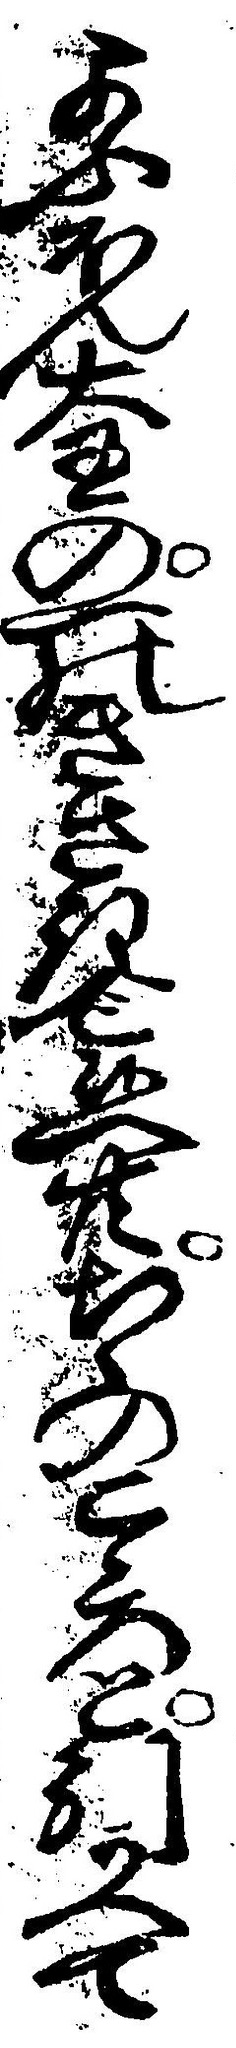よふほん大王の。一のきさきで候へ共。ちゝのこゝろと。引かへて
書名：目連尊者地獄めくり / 宇留藤太夫正本
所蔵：東京大学総合図書館 General Library in the University of Tokyo, JAPAN
